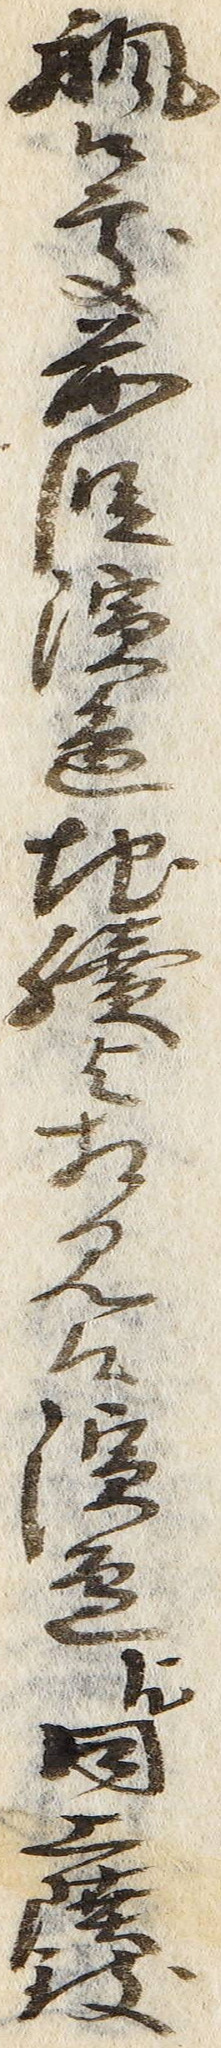䑺候處前段濱邊地續と相見候濱邊江同上陸致
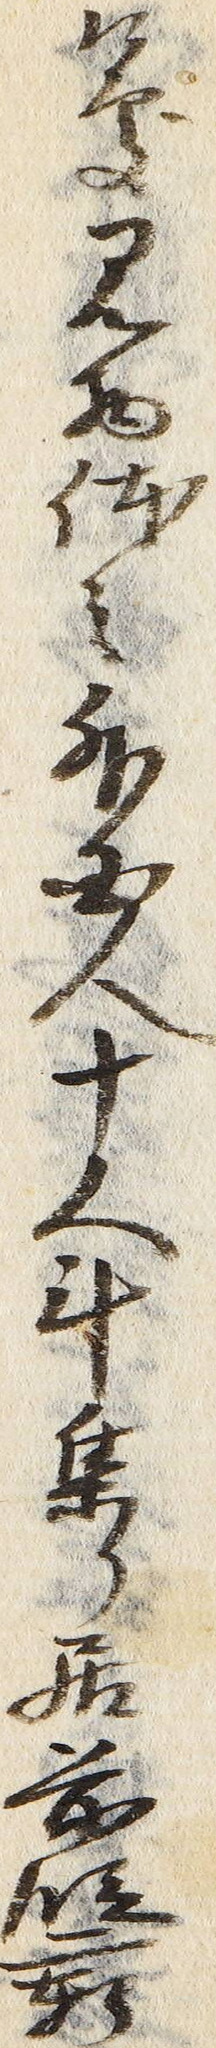候處見物体之外国人十人斗集り居前段二軒
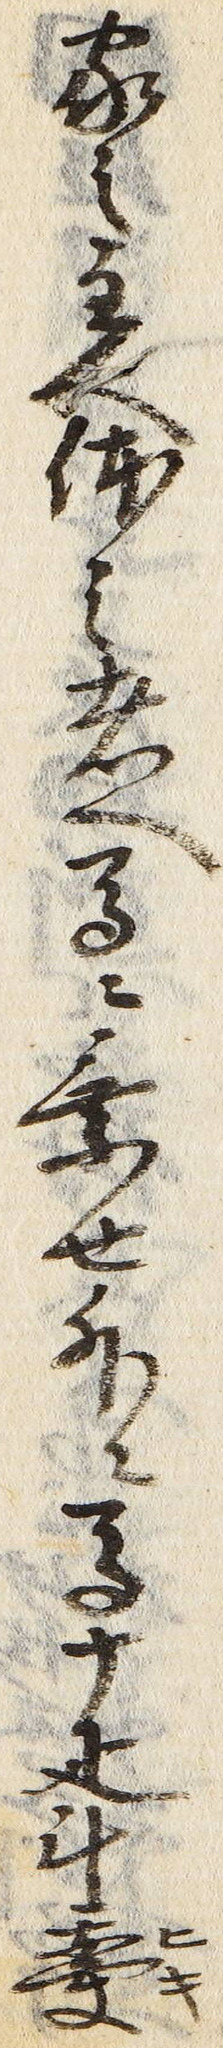家之主人体之者へ馬ニ乗せ外ニ馬十疋斗索
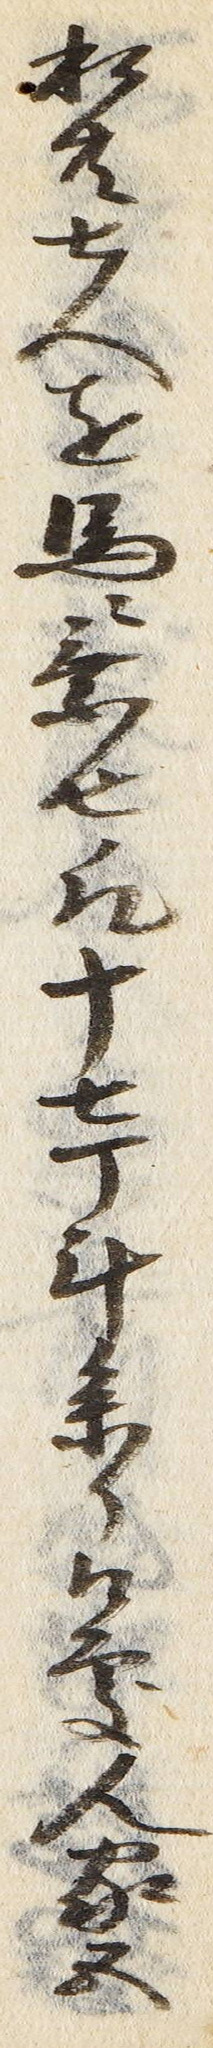私共七人を馬ニ乗せ凡十七丁斗参り候處人家五
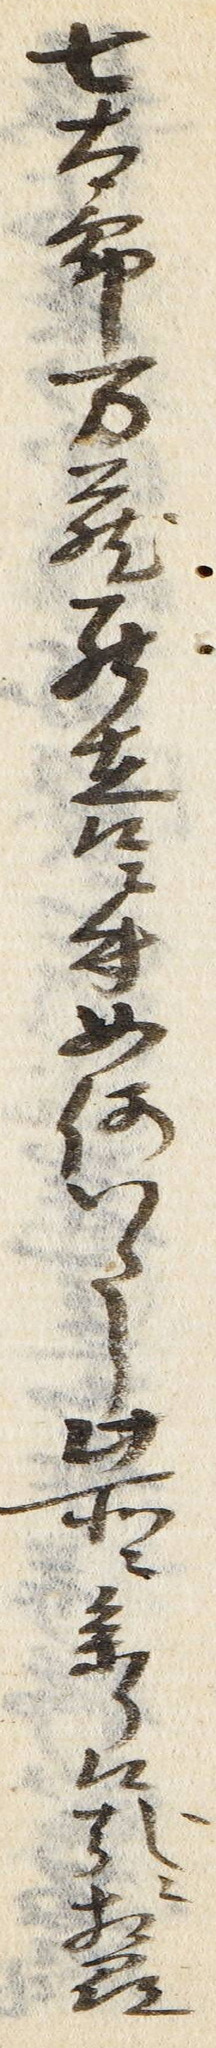七太郎万蔵罷在候ニ付如何いたし此所ニ参り候哉ニ相尋
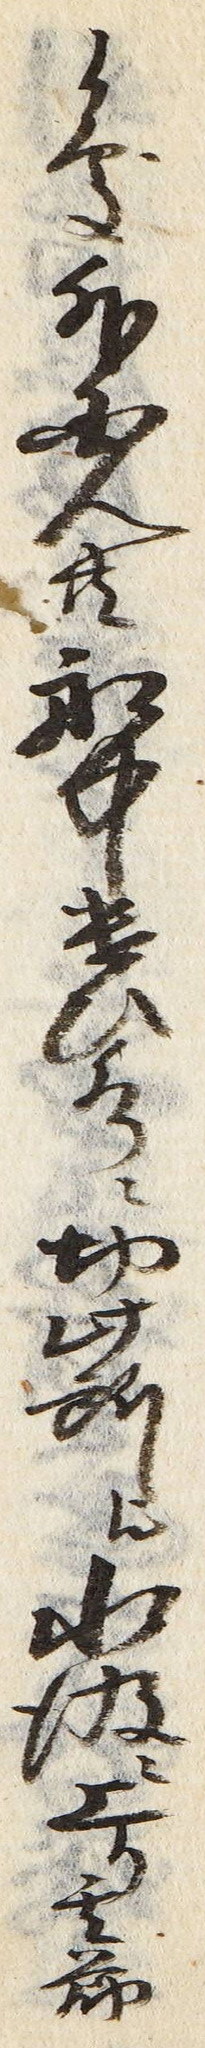候處外国人共舩中遣ひ水ニ切此所江水汲ニ上り其節
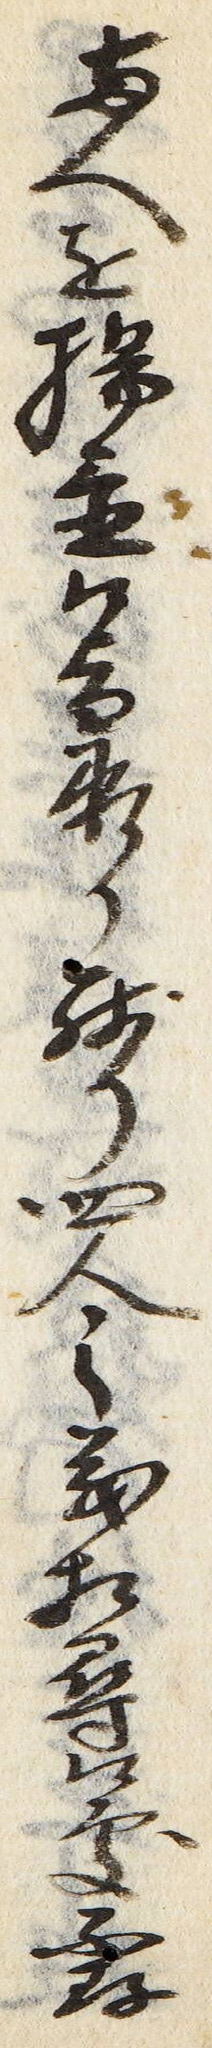両人を揚置候旨承り残り四人之義相尋候處不存
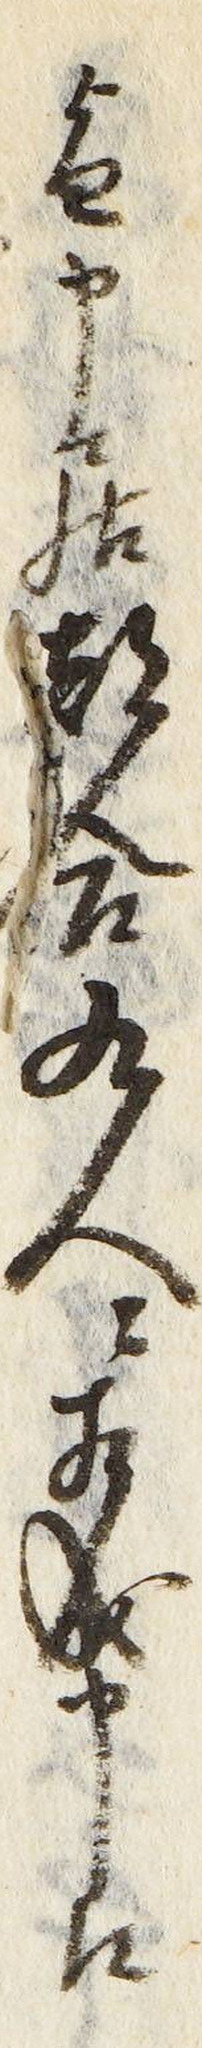旨申居都合九人ニ相成申候
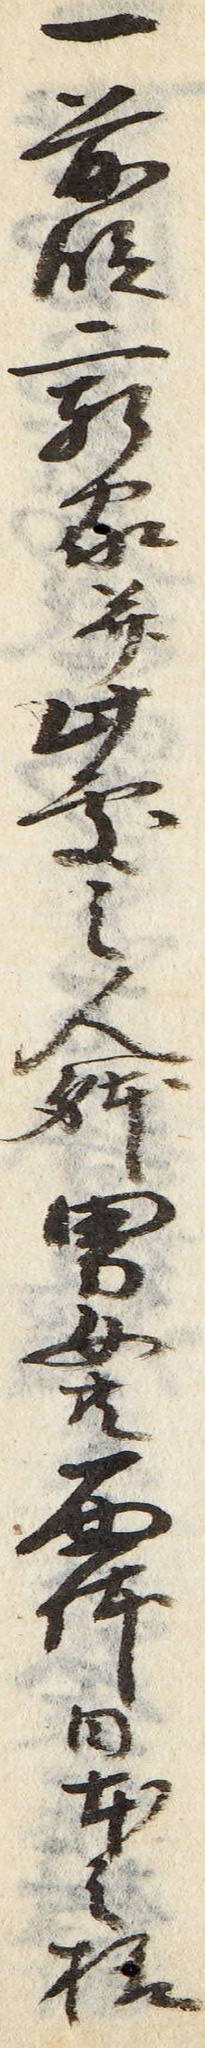一前段二軒家幷此處之人躰男女共面体日本之様

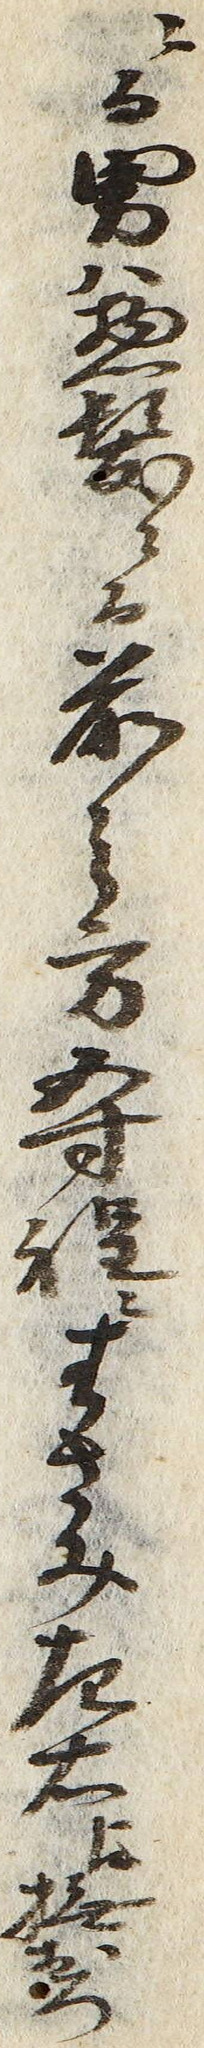ニ而男ハ惣髪ニ而前之方五寸程ニはさみ左右江撫おろ
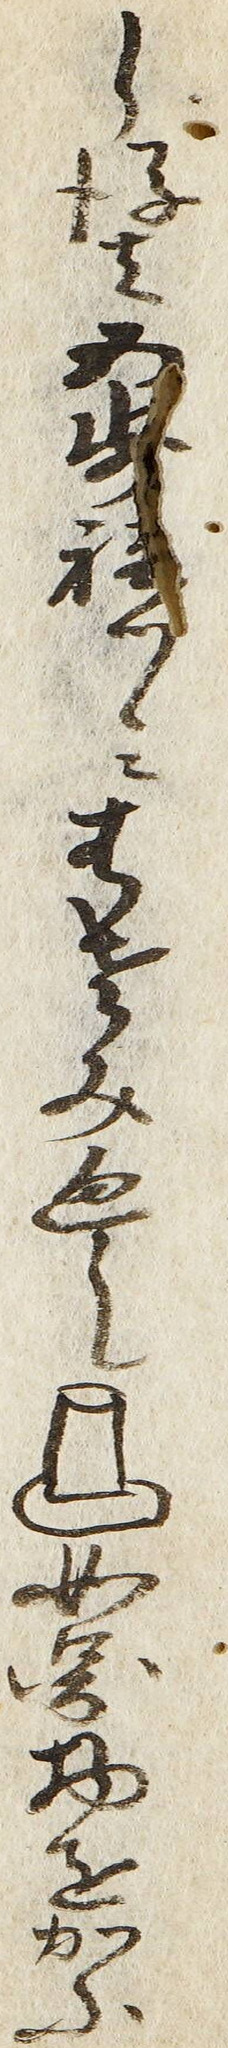し後者五歩程ツヽニはさみ廻し如圖物をかふ
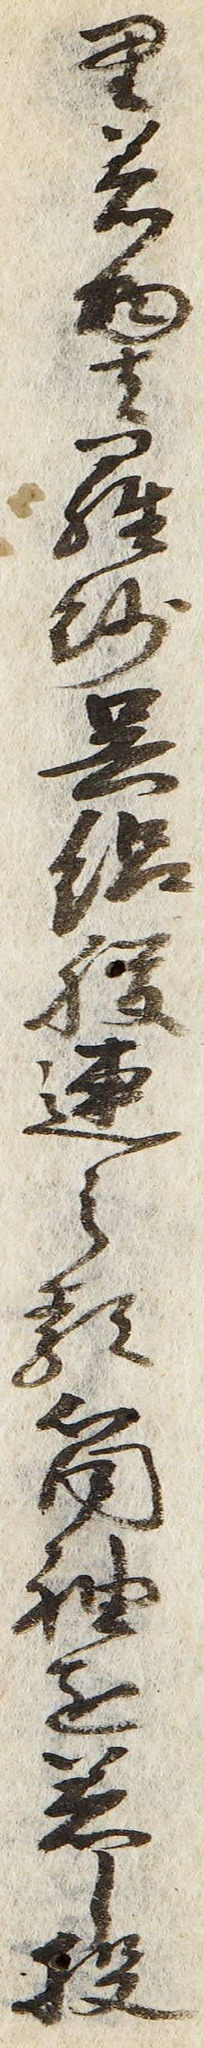り着物者羅紗呉絽服連之類筒袖を着し股
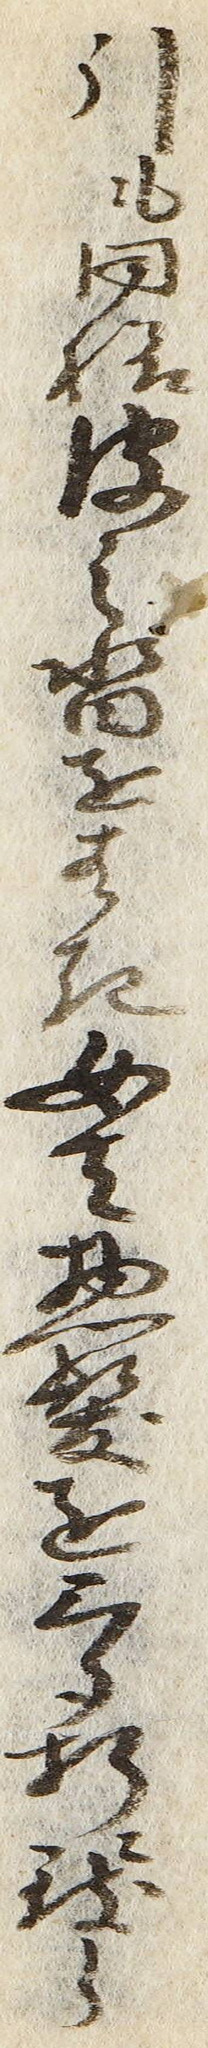引も同様皮之沓をはき女者惣髪を三ツ折ニ致し
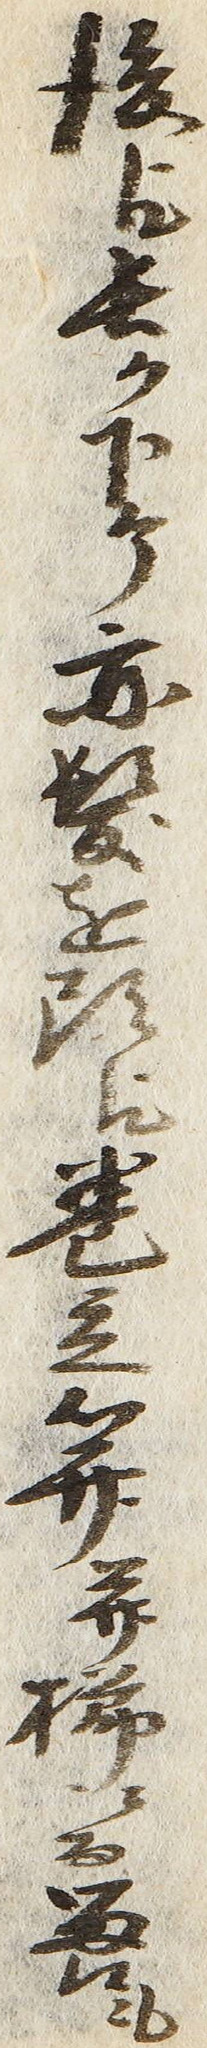後江長ク下ケ亦髪を頭江巻立笄幷櫛ニ而留候も
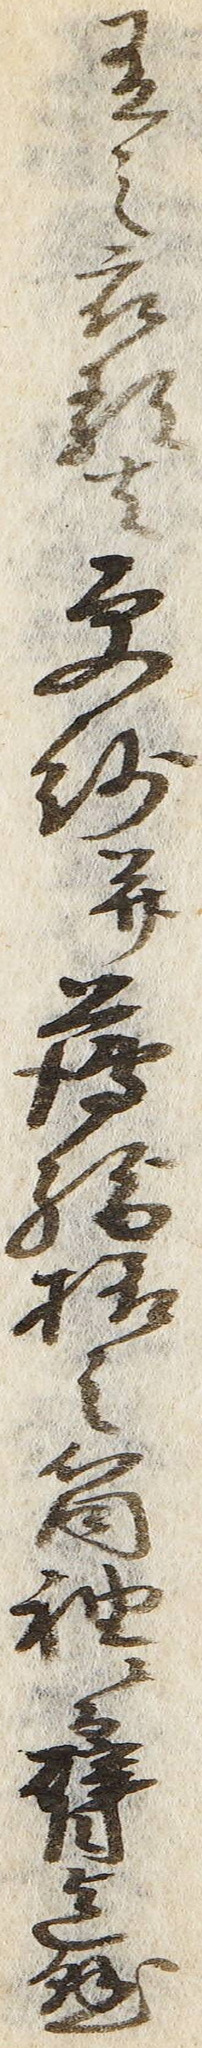有之衣類者更紗幷薄絹様之筒袖ニ而臂迄懸
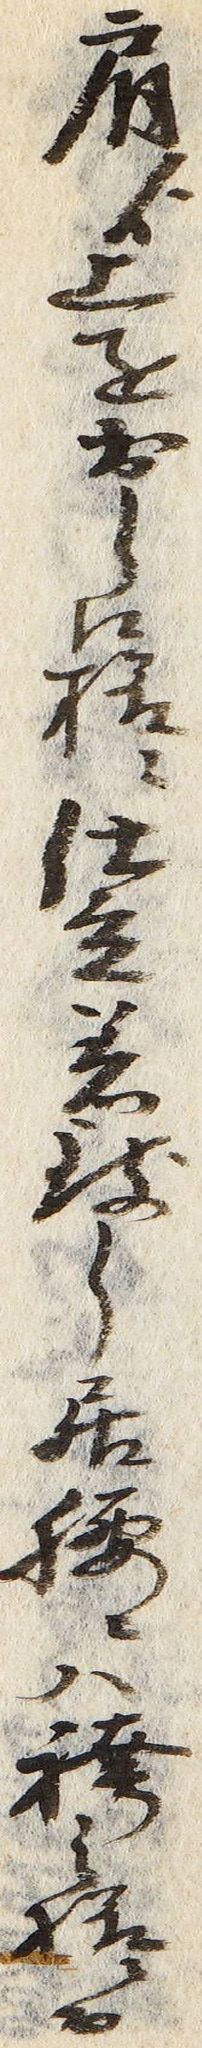肩ゟ上を出し候様ニ仕立着致し居腰ニハ袴之様ニ而
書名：漂流人善助聞書
